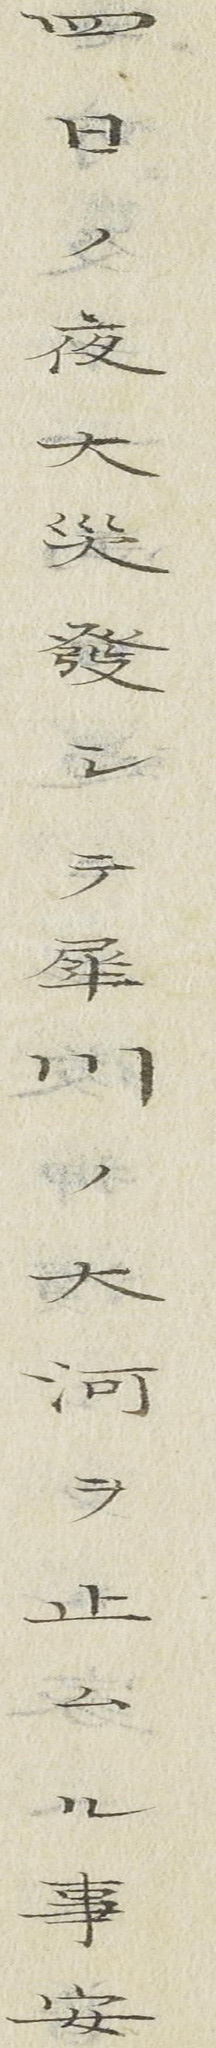四日ノ夜大災発シテ犀川ノ大河ヲ止ムル事安
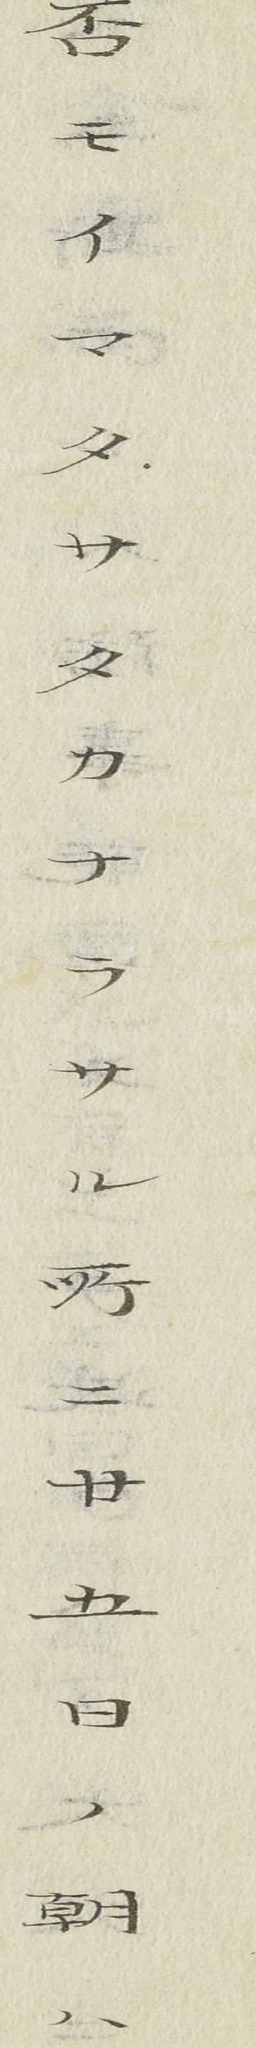否モイマタサタカナラサル所ニ廿五日ノ朝ハ
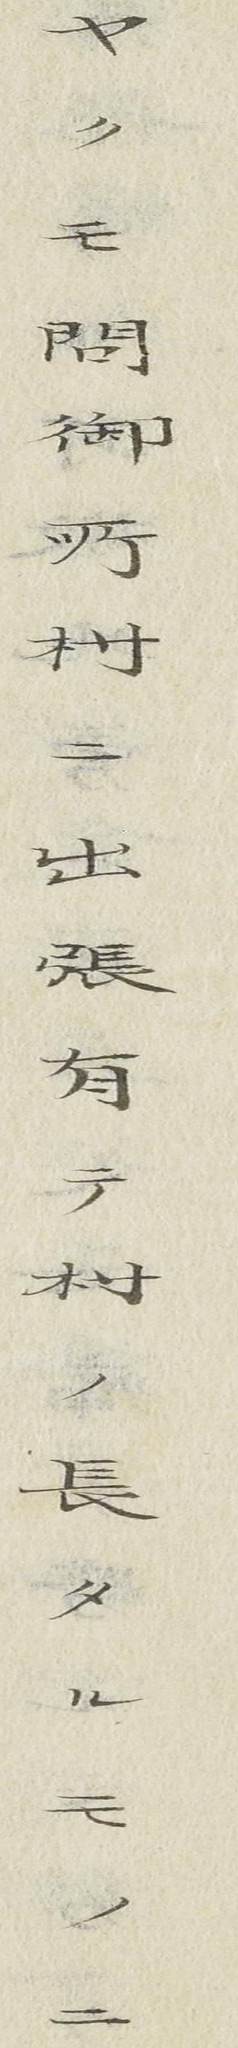ヤクモ問御所村ニ出張有テ村ノ長タルモノニ
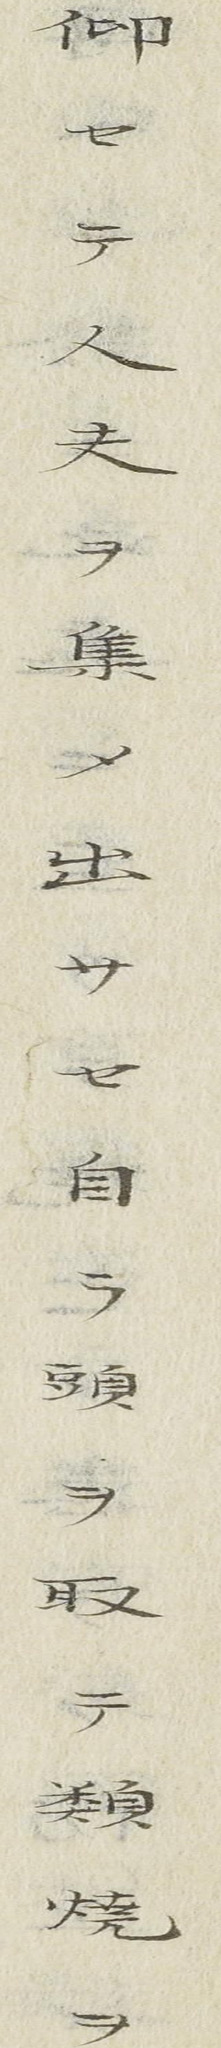仰セテ人夫ヲ集メ出サセ自ラ頭ヲ取テ類焼ヲ
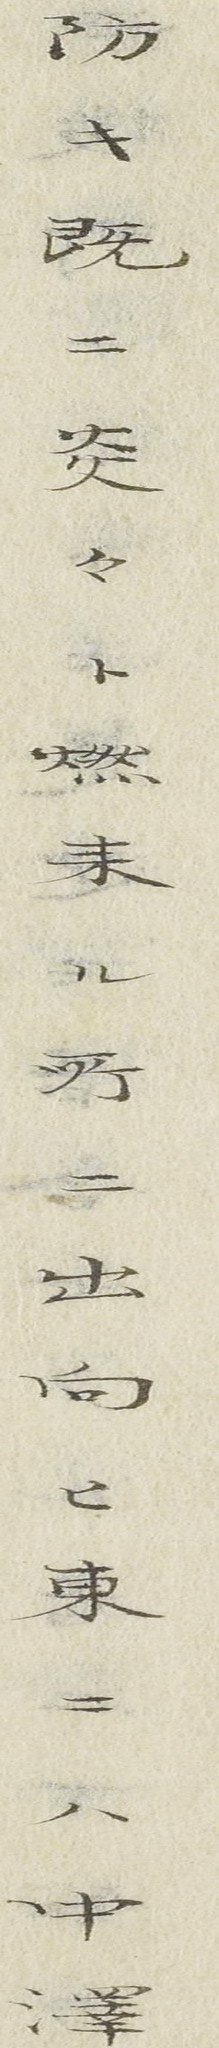防キ既ニ炎々ト燃来ル所ニ出向ヒ東ニハ中沢
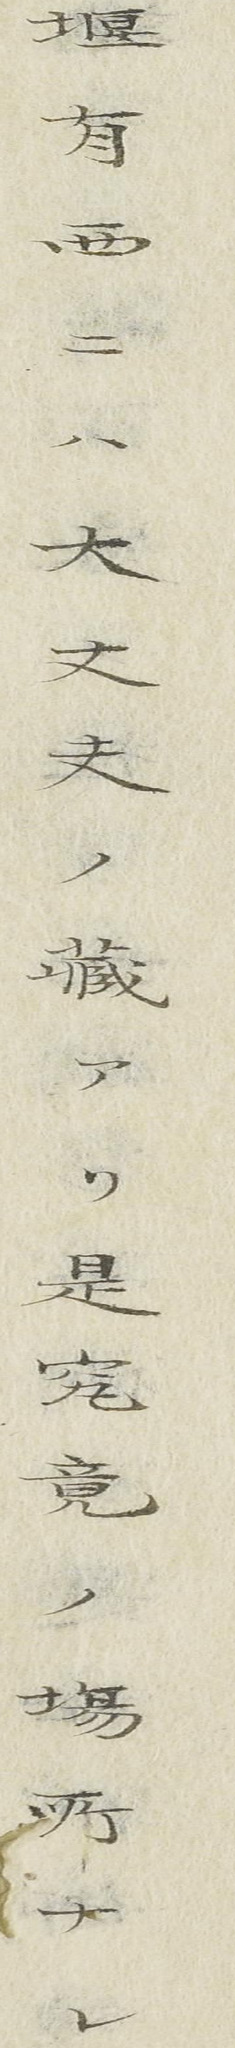堰有西ニハ大丈夫ノ蔵アリ是究竟ノ場所ナレ
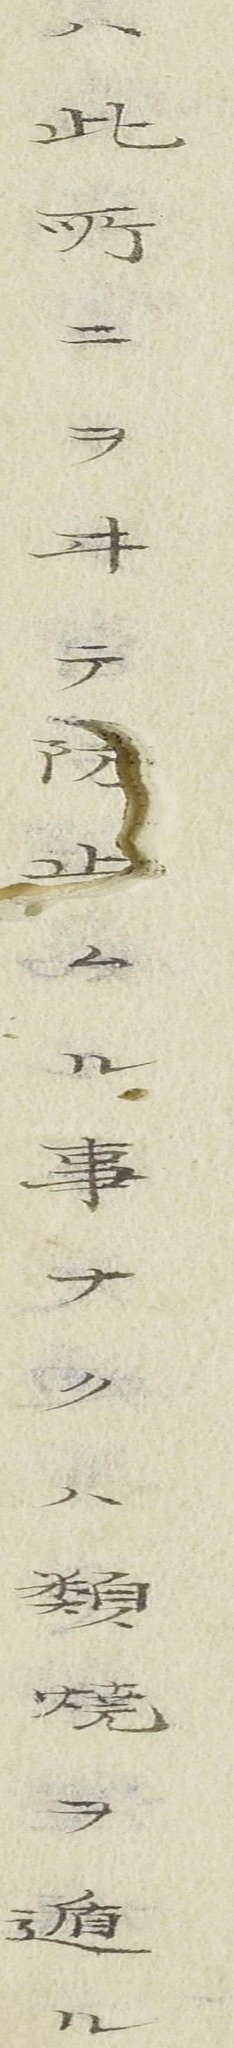ハ此所ニヲヰテ防止ムル事ナクハ類焼ヲ遁ル

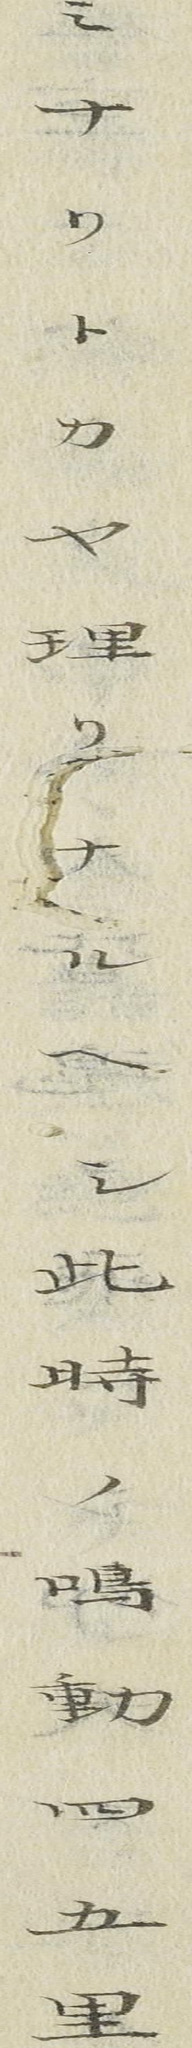ミナリトカヤ理リナルヘシ此時ノ鳴動四五里
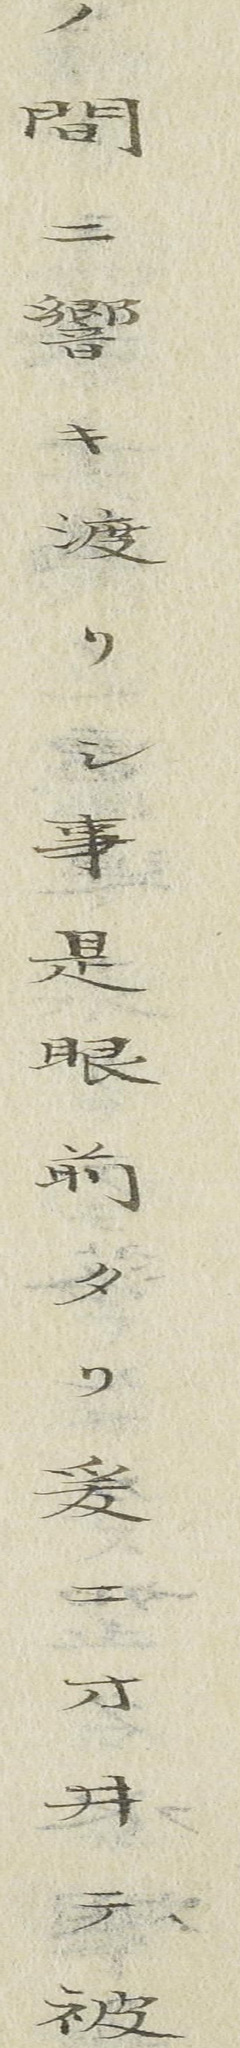ノ間ニ響キ渡リシ事是眼前タリ爰ニオヰテ被
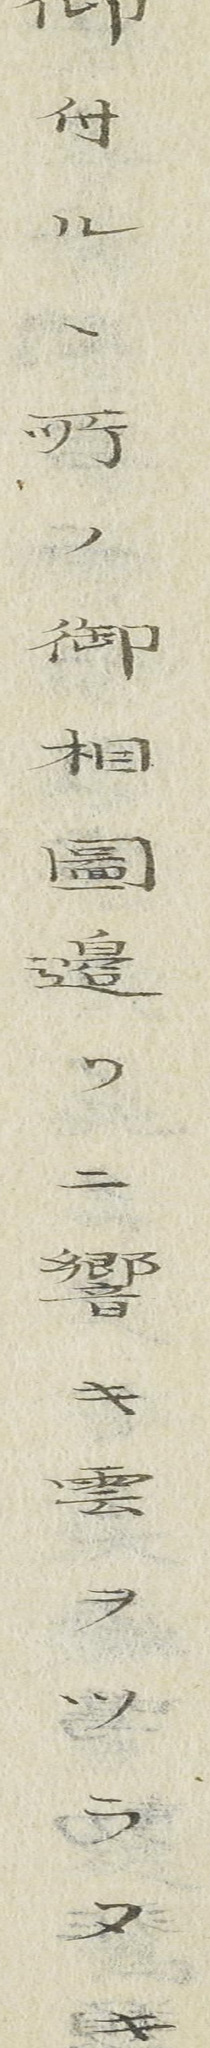仰付ルヽ所ノ御相図辺リニ響キ曇ヲツラヌキ
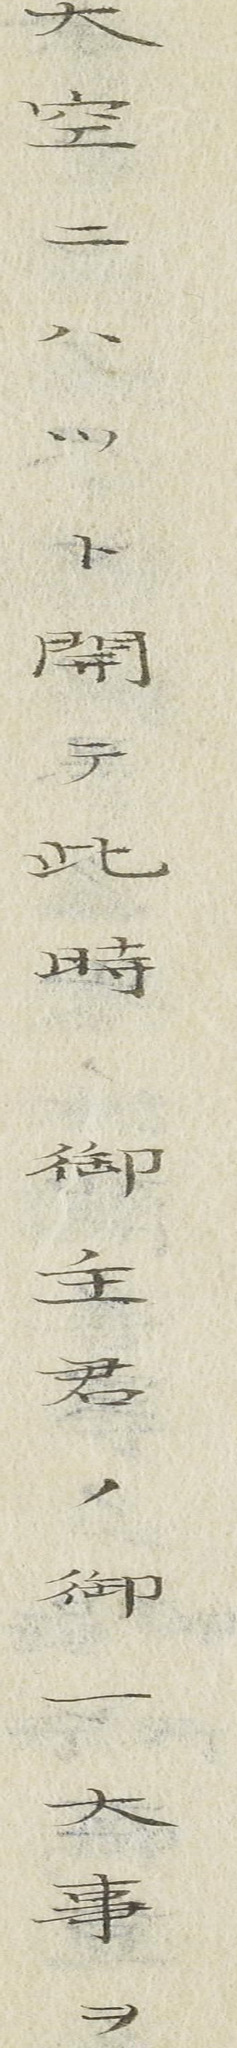大空ニハツト開テ此時御主君ノ御一大事ヲ
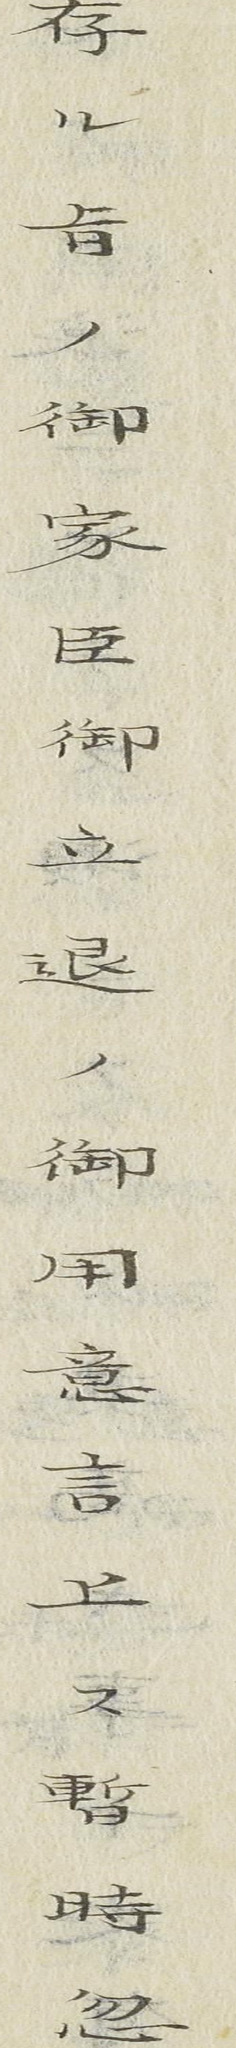存ル旨ノ御家臣御立退ノ御用意言上ス暫時忽
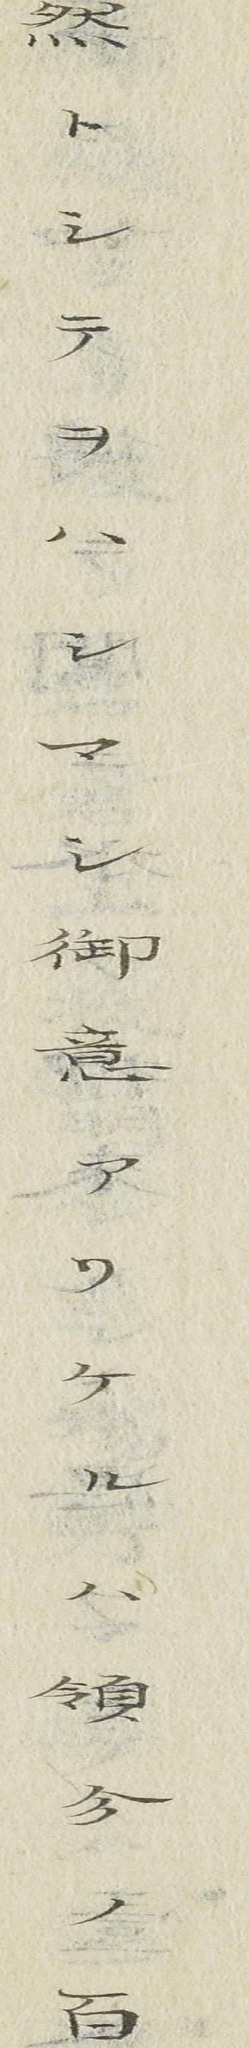然トシテヲハシマシ御意アリケルハ領分ノ百
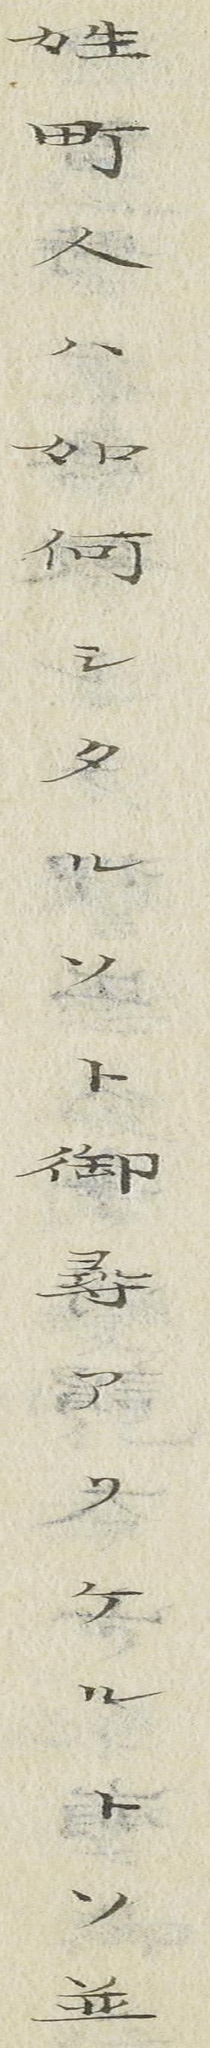姓町人ハ如何シタルソト御尋アリケルトソ並
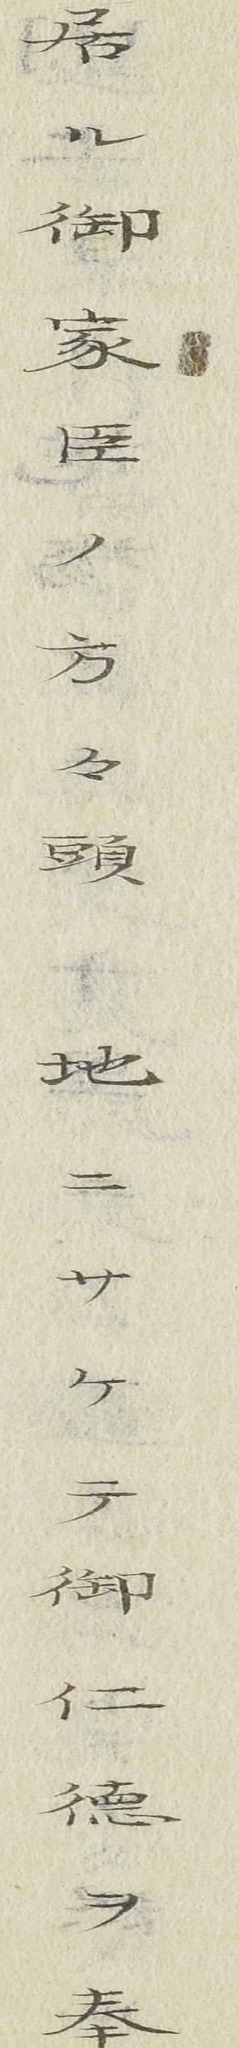居ル御家臣ノ方々頭地ニサケテ御仁徳ヲ奉
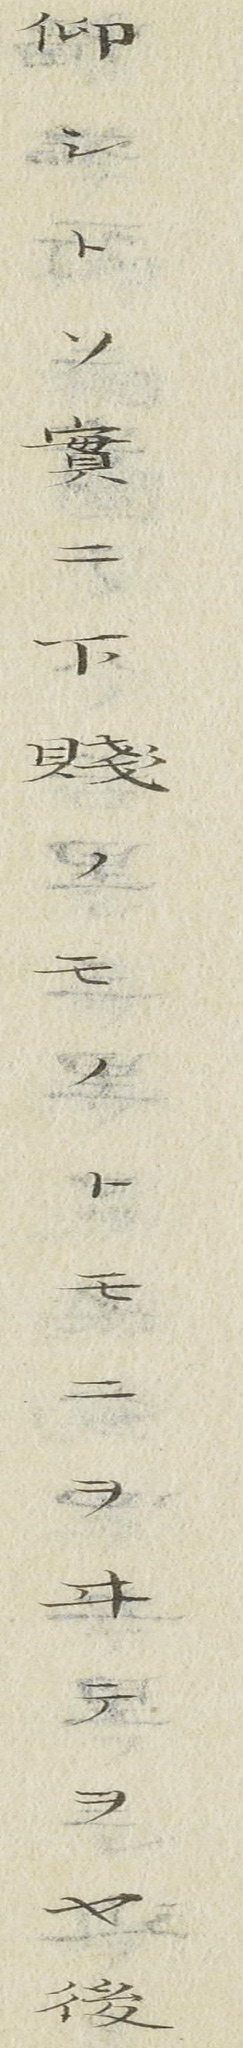仰シトソ実ニ下賤ノモノトモニヲヰテヲヤ後
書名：地災撮要　地震之部　巻ノ二
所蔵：東京大学地震研究所図書室 Earthquake Research Institute Library, The University of Tokyo, JAPAN
